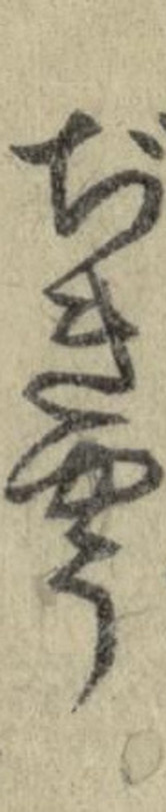ぢきやう
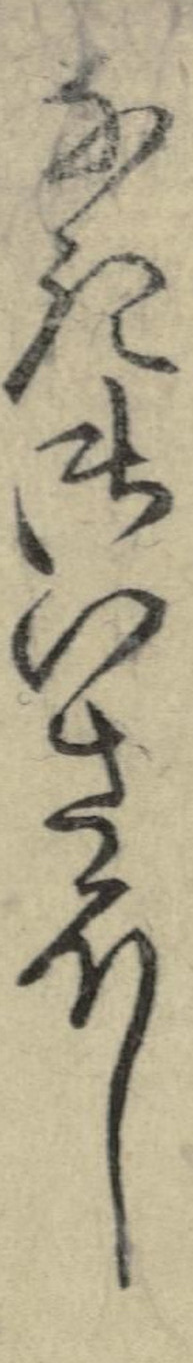なき御いさほし
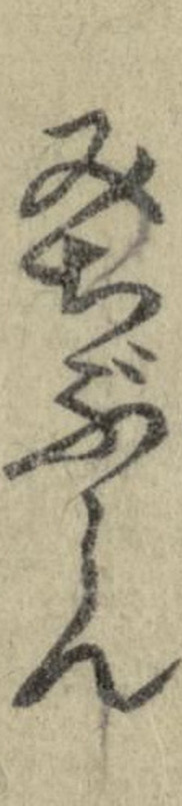みちぶしん
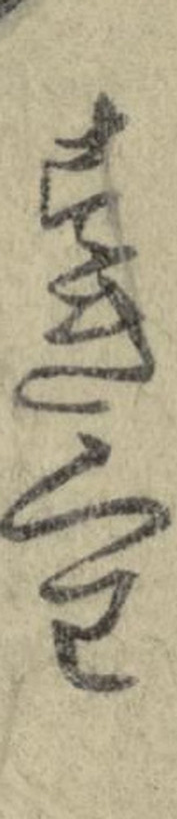すきくわ
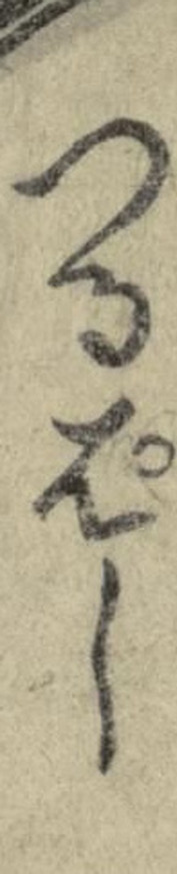つるぱし
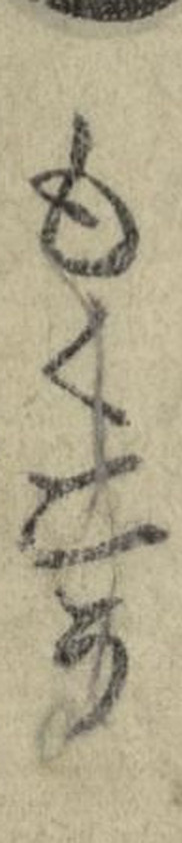もくこう
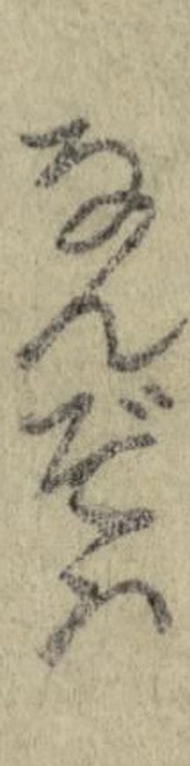なんぞは
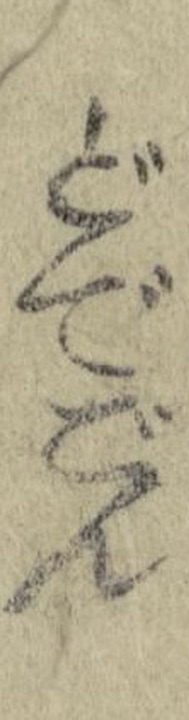どでごん
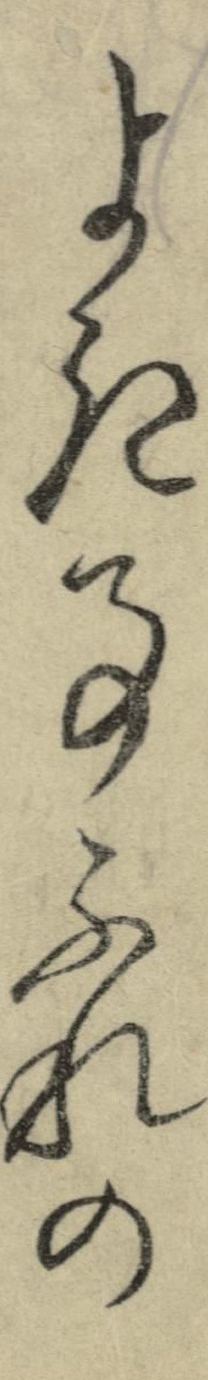よき事ふれの
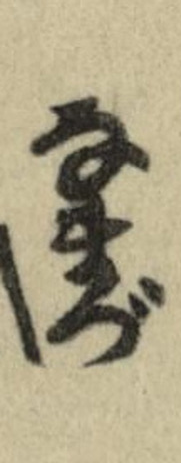なまづ
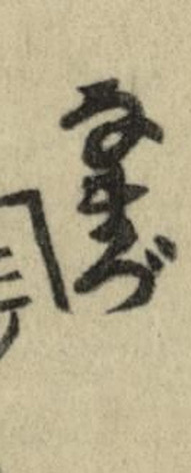なまづ
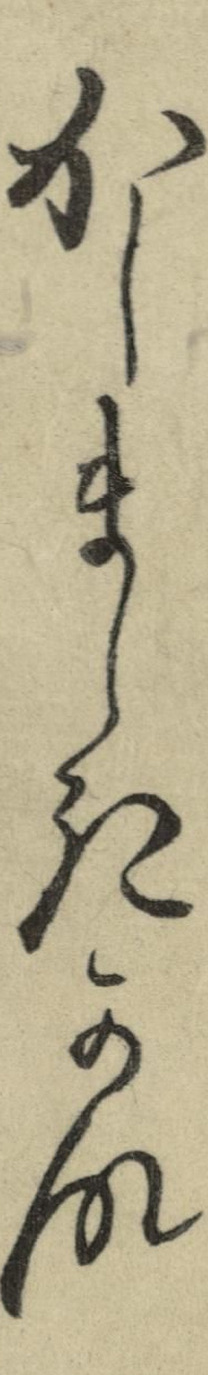かしましきかな
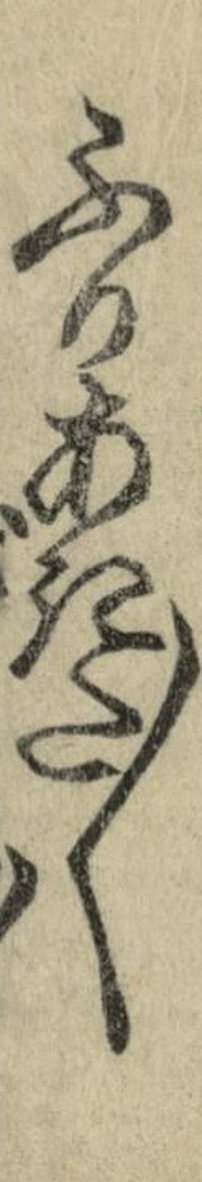ふりあきた〳〵
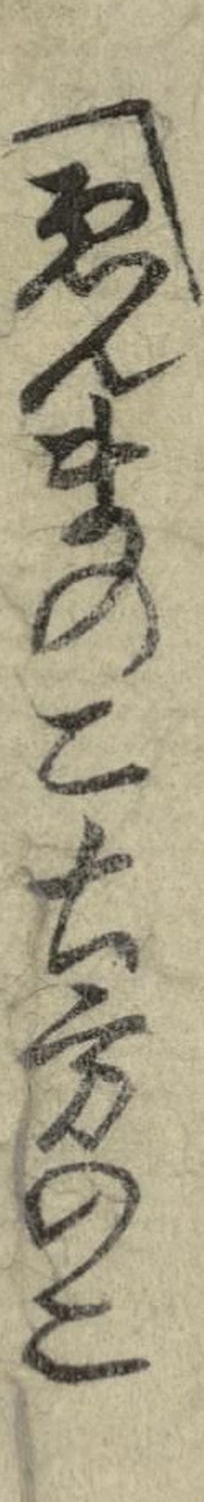〽ゑんまのこ土方のこ
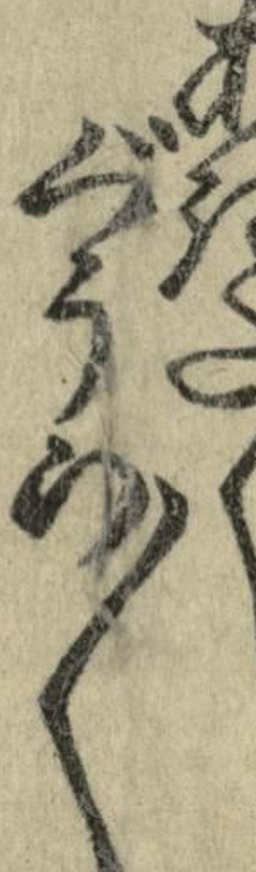ぐうら〳〵
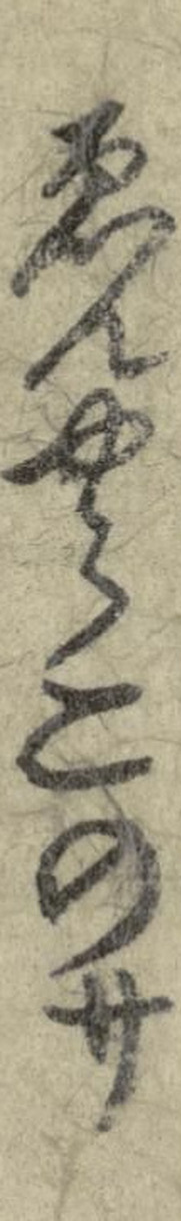ゑんやらこのサ
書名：鹿島恐
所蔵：東京大学地震研究所図書室 Earthquake Research Institute Library, The University of Tokyo, JAPAN
